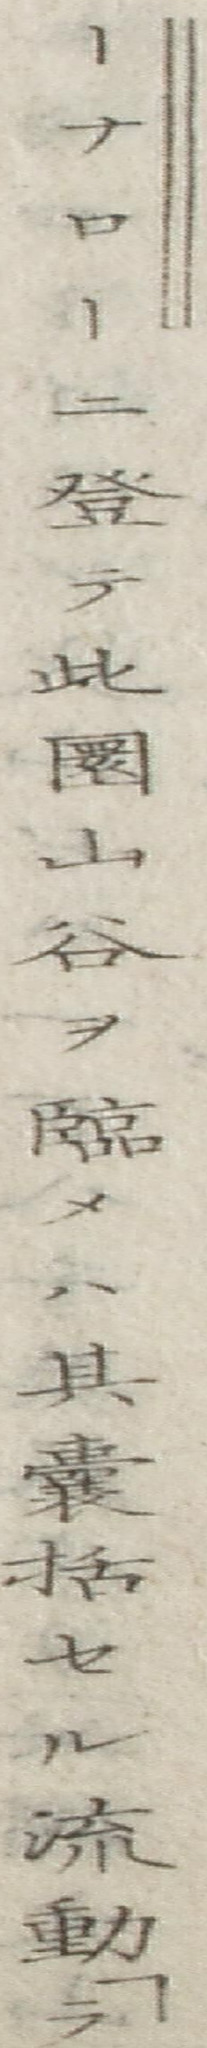－ナローニ登テ此園山谷ヲ臨メハ其囊括セル流動「ラ
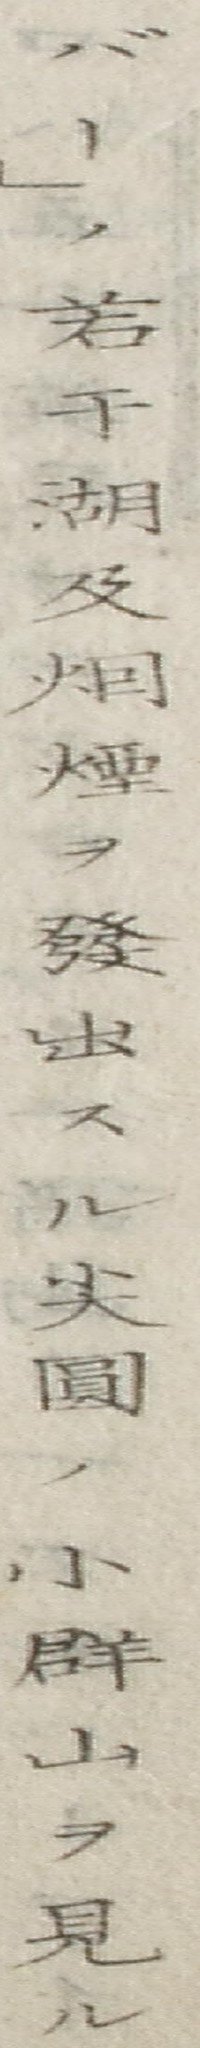バー」ノ若干湖及𤇆煙ヲ発出スル尖円ノ小群山ヲ見ル
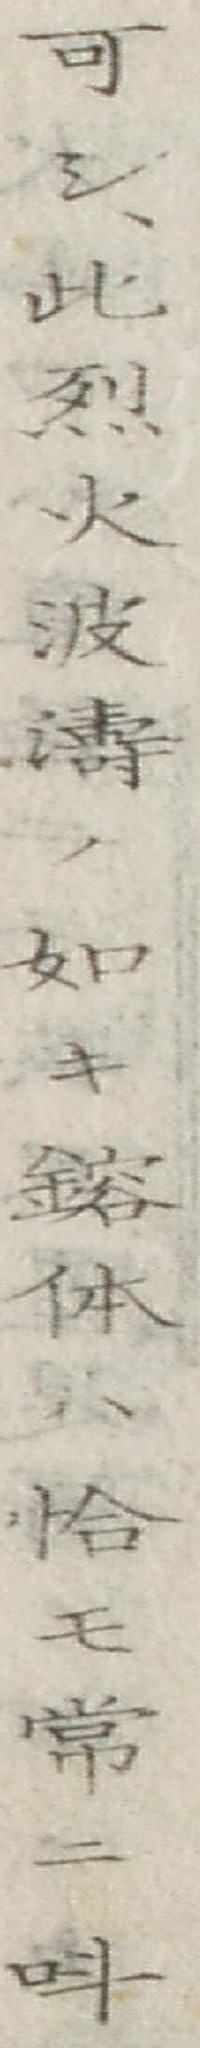可シ、此烈火波涛ノ如キ鎔体ハ恰モ常ニ叫
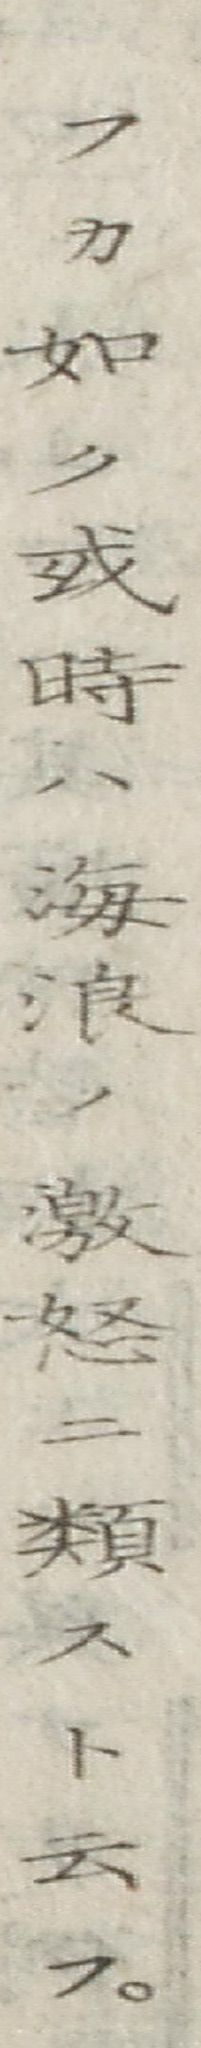フカ如ク或時ハ海浪ノ激怒ニ類スト云フ。
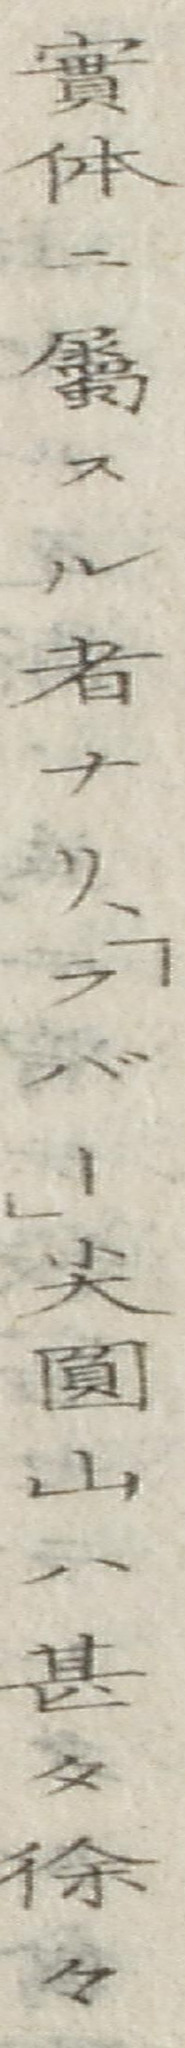実体ニ属スル者ナリ、「ラバー」尖円山ハ甚タ徐々
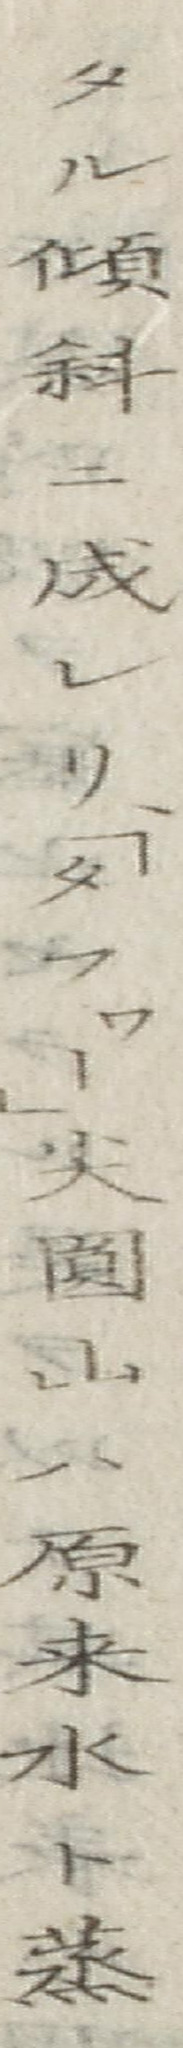タル傾斜ニ成レリ、「タフヮ－」尖円山ハ原来水ト蒸
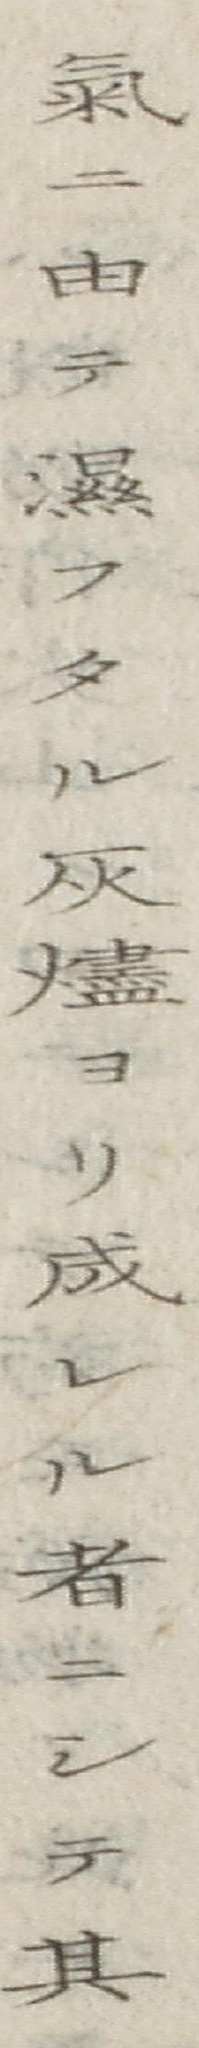気ニ由テ湿フタル灰燼ヨリ成レル者ニシテ其
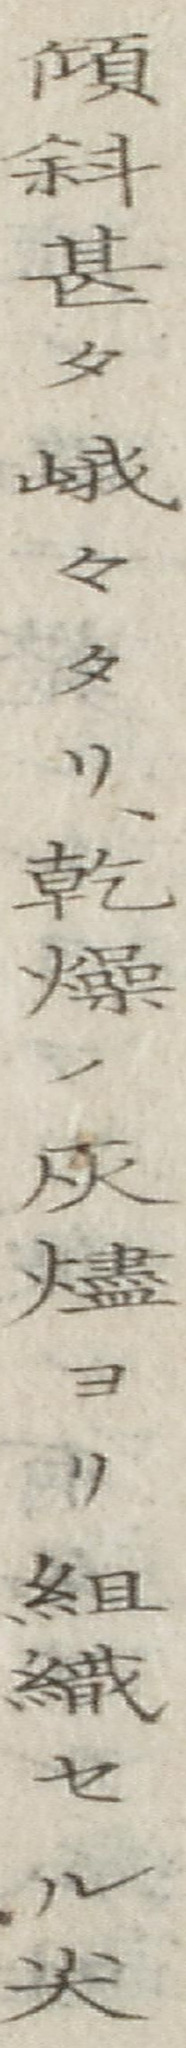傾斜甚タ峨々タリ、乾燥ノ灰燼ヨリ組織セル尖
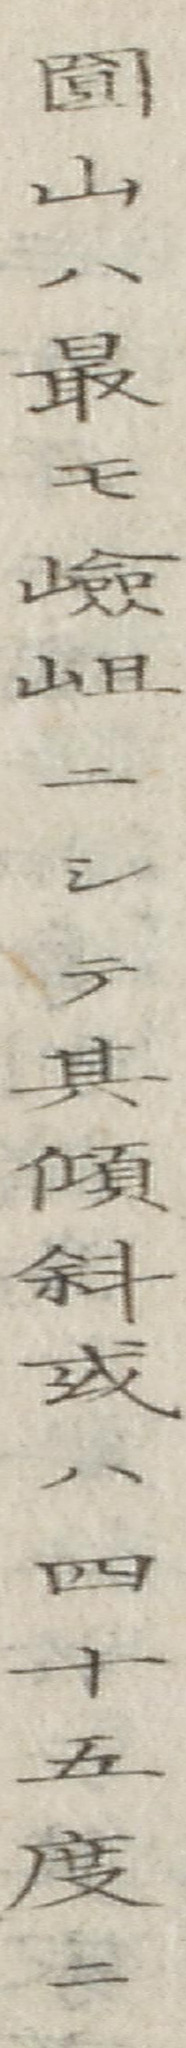円山ハ最モ嶮岨ニシテ其傾斜或ハ四十五度ニ
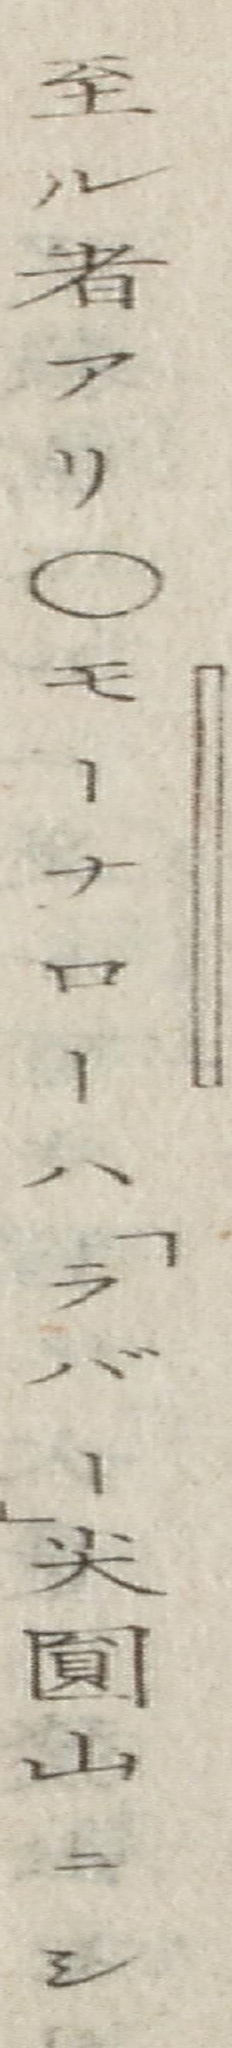至ル者アリ〇モーナローハ「ラバー」尖円山ニシ
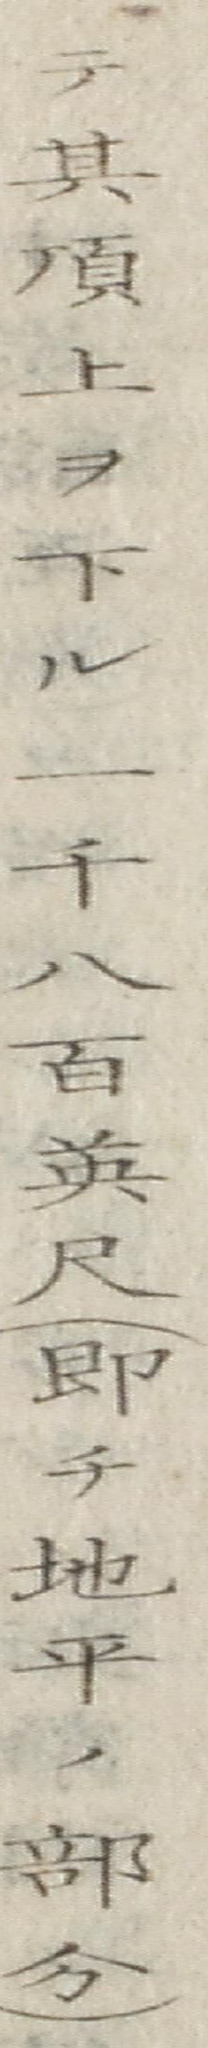テ其頂上ヲ下ル一千八百英尺
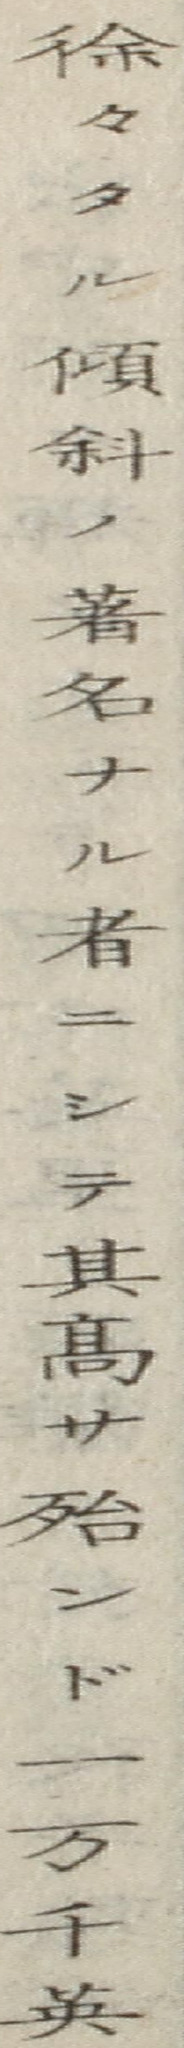徐々タル傾斜ノ著名ナル者ニシテ其高サ殆ンド一万千英
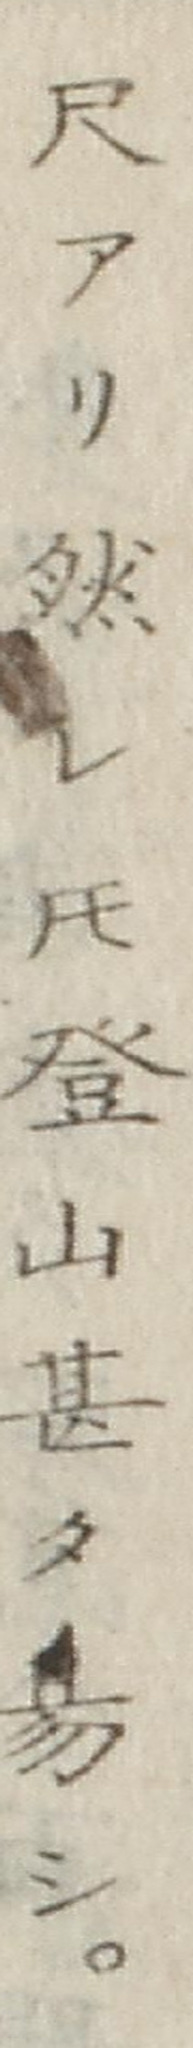尺アリ然レトモ登山甚タ易シ。
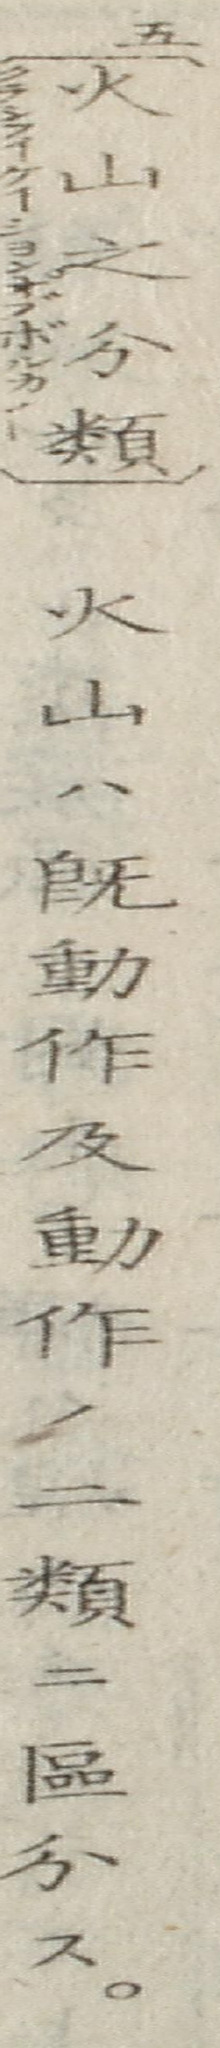五[火山之分類]火山ハ既動作及動作ノ二類ニ区分ス。
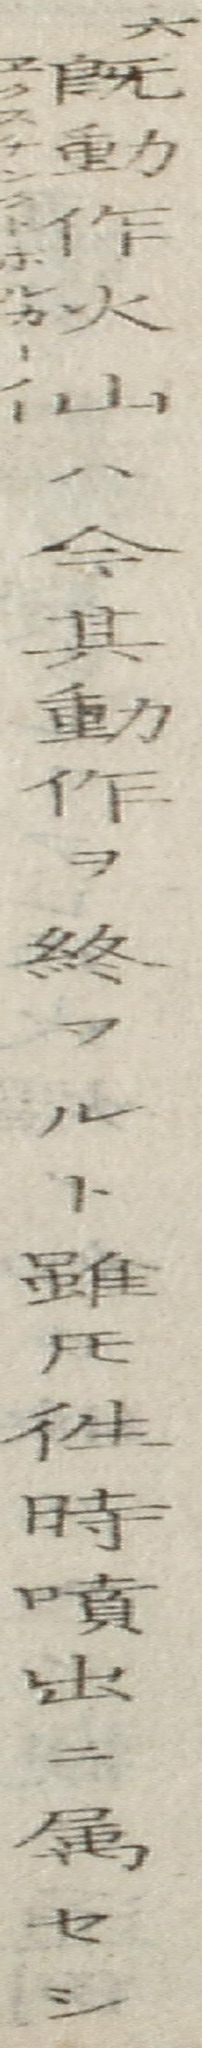六既動作火山ハ今其動作ヲ終フルト雖トモ往時噴出ニ属セシ
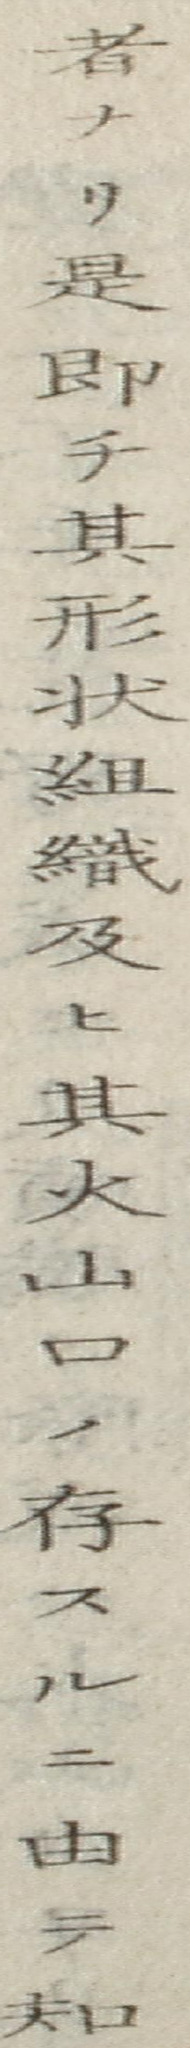者ナリ是即チ其形状組織及ヒ其火山口ノ存スルニ由テ知
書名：地形論　巻二
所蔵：東京大学地震研究所図書室 Earthquake Research Institute Library, The University of Tokyo, JAPAN
